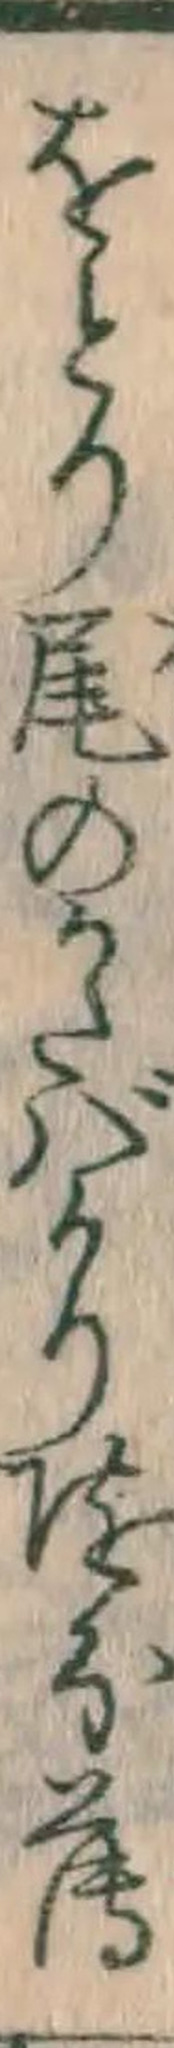をとり尾のかたばかり随分薄
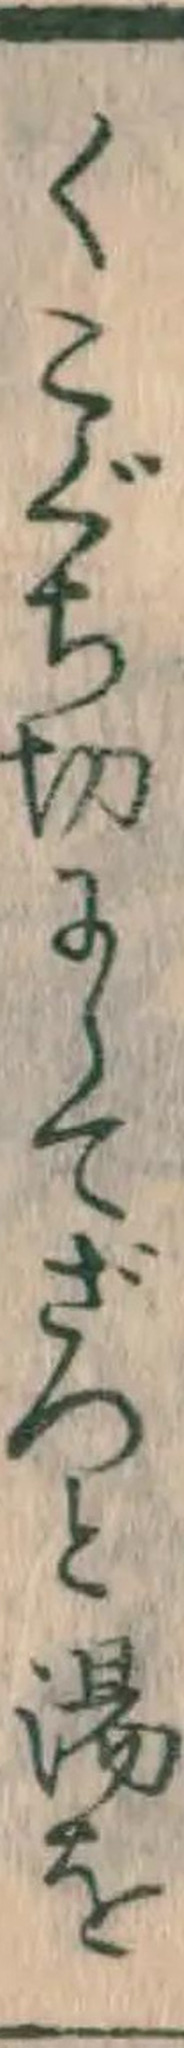くこぐち切にしてざつと湯を
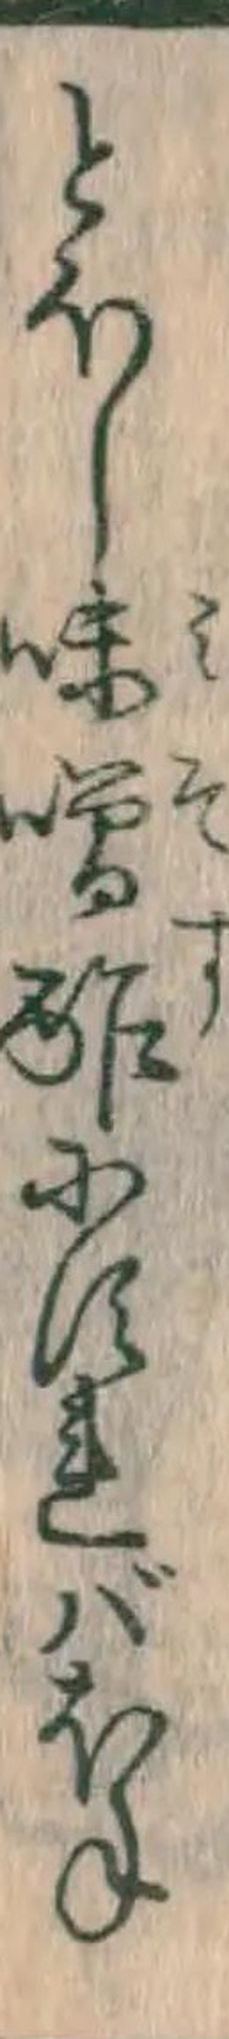とほし味噌酢にすればほね
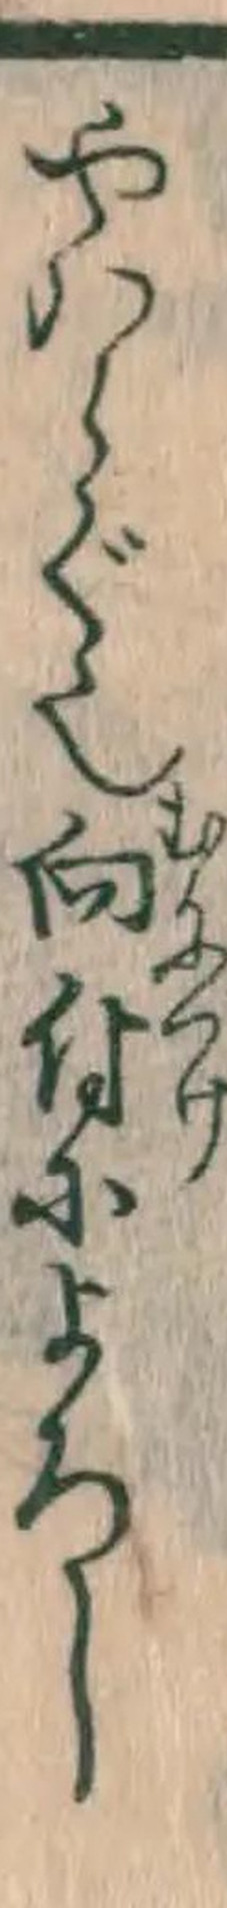やはらぐ也向付によろし
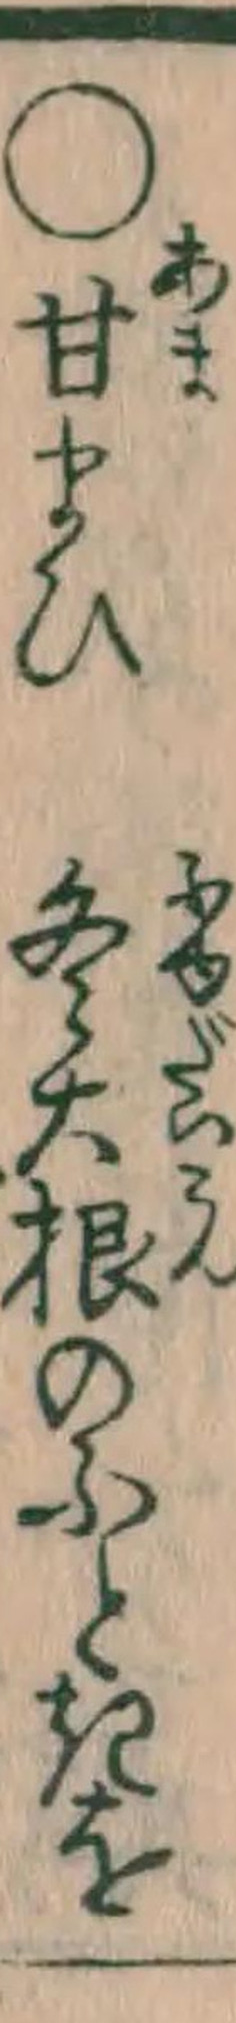○甘まひ冬大根のふときを
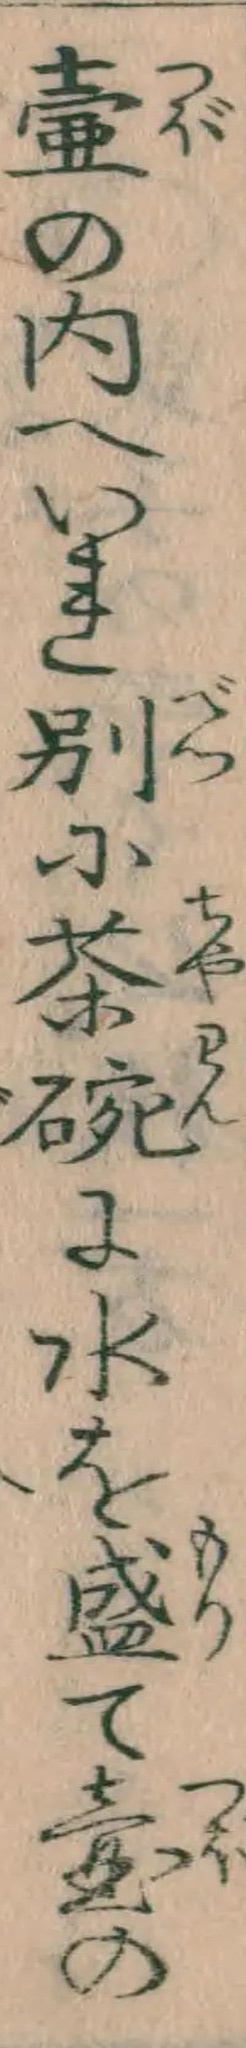壺の内へいれ別に茶碗に水を盛て壺の
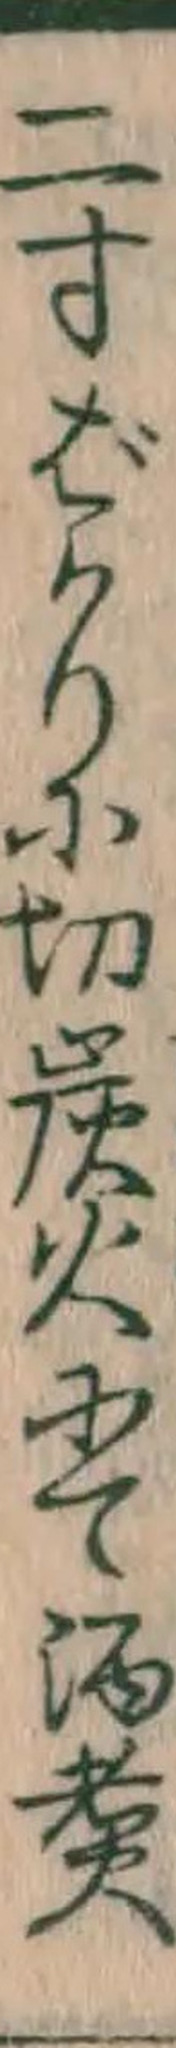二寸ばかりに切炭火にて酒煮
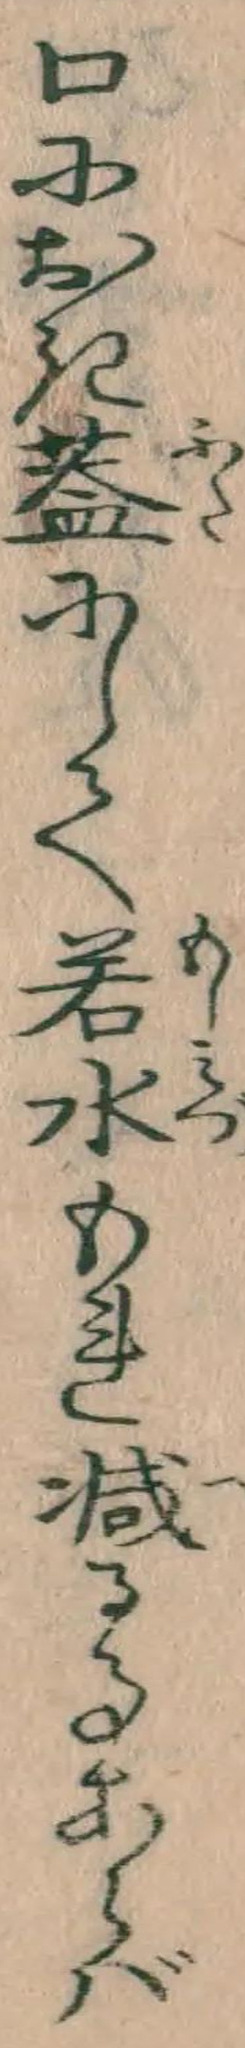口におき蓋にして若水もれ減る事あらば
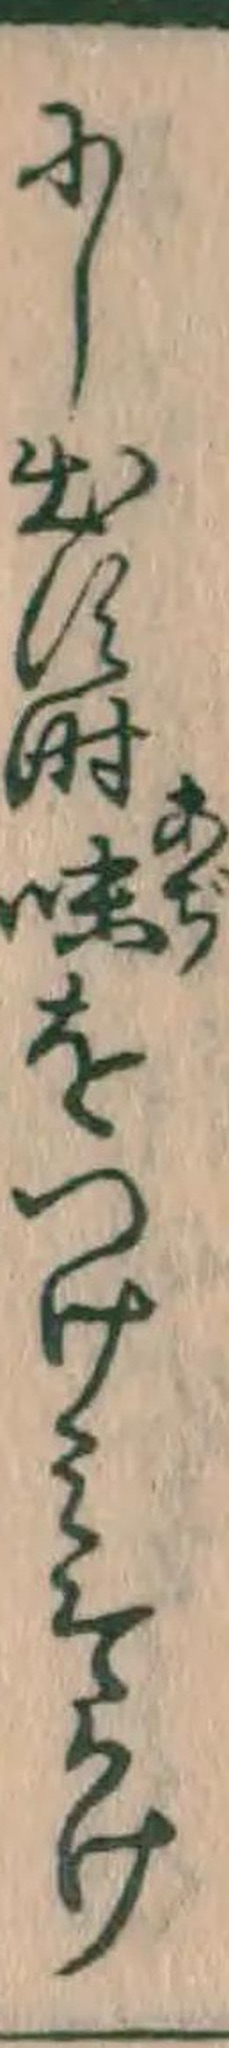にし出す時味をつけみそかけ
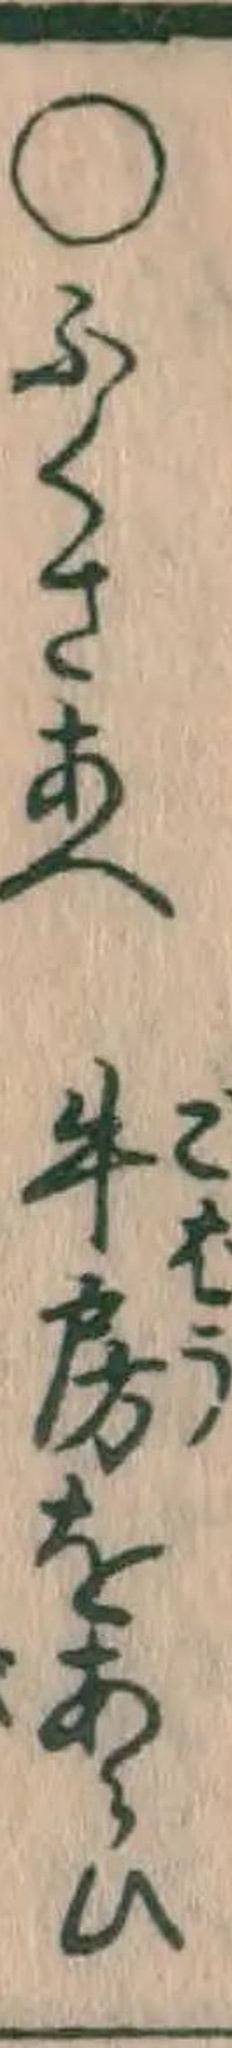○ふくさあへ牛房をあらひ
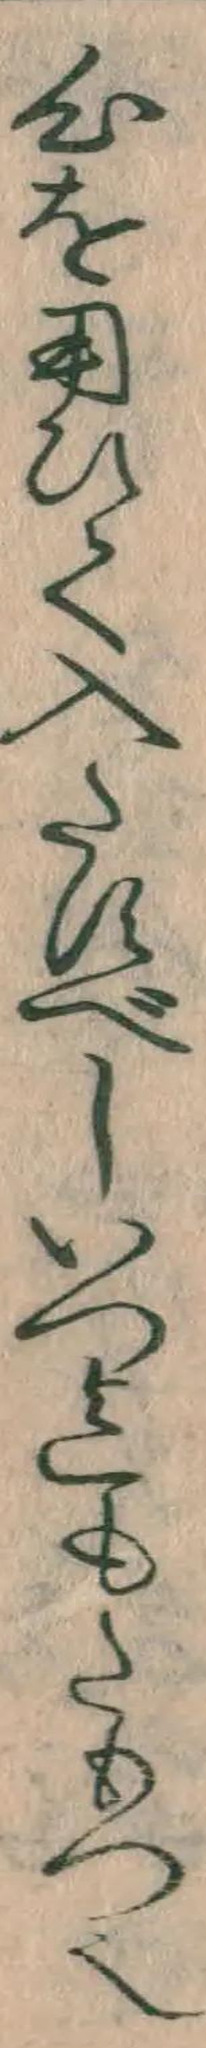心を用ひて入たすべしいつ迄もたもつ也
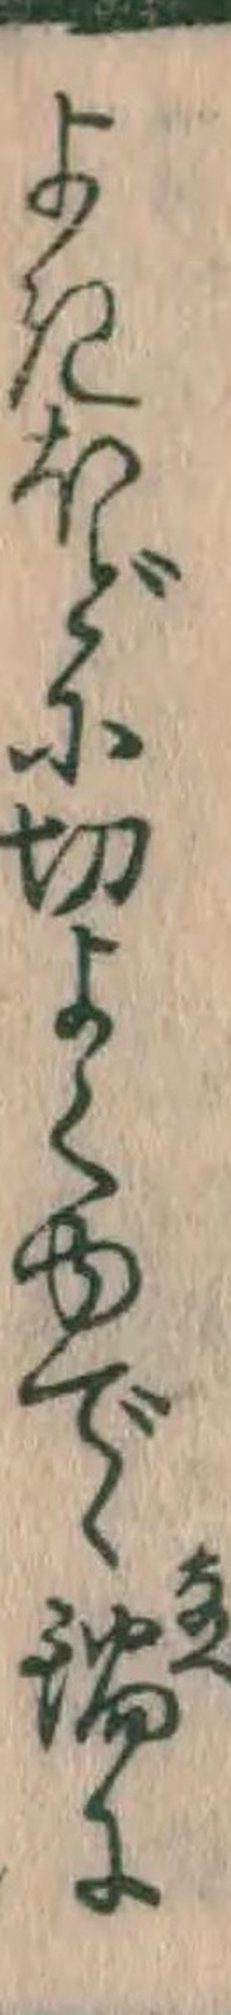よきほどに切よくゆでゝ鍋に
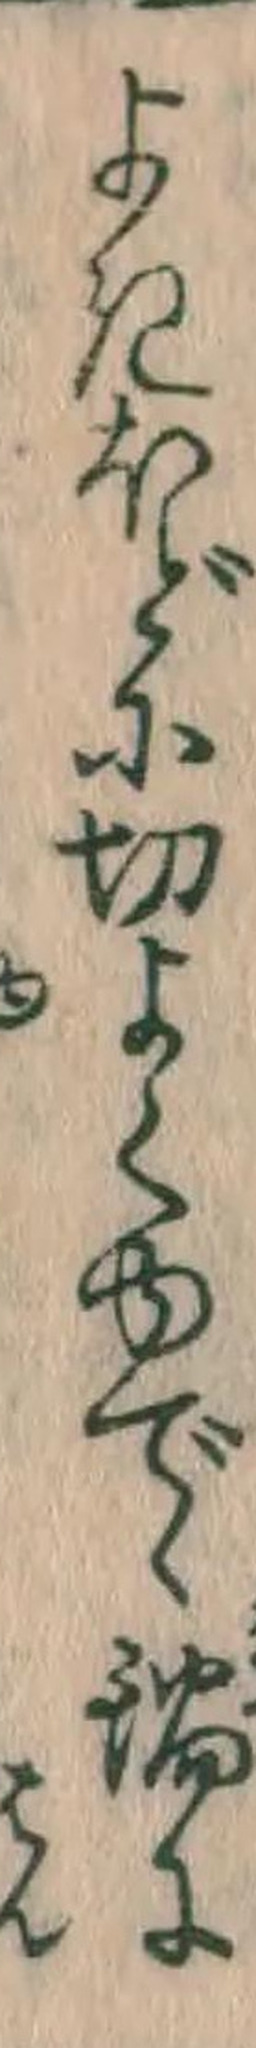よきほどに切よくゆでゝ鍋に
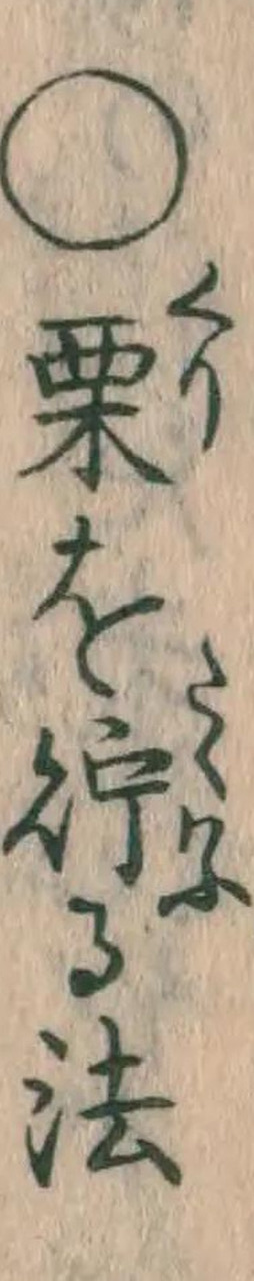○栗を貯る法
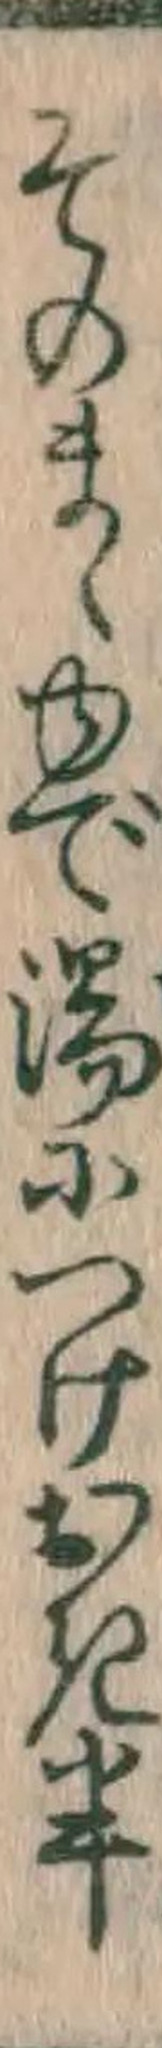そのまゝゆで湯につけおき半
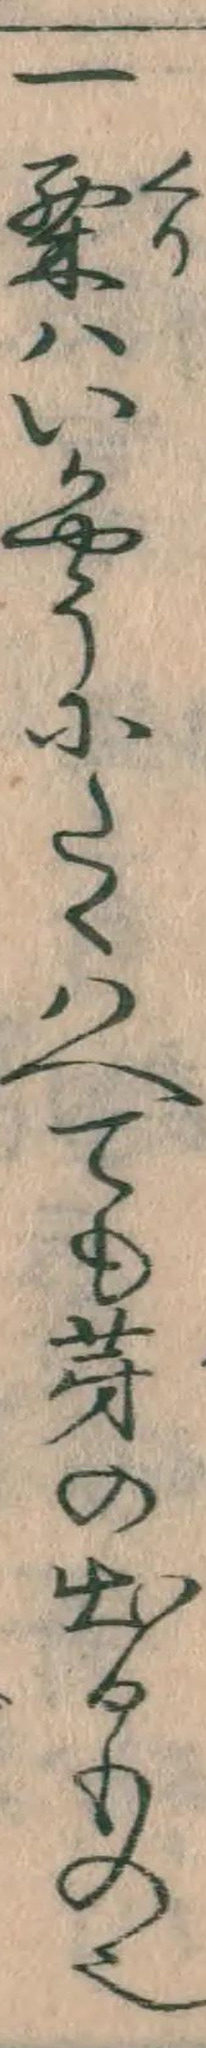一栗はいかやうにたくはへても芽の出るもの也
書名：広益秘事大全 3巻. [5]
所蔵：国立国会図書館 National Diet Library, JAPAN
